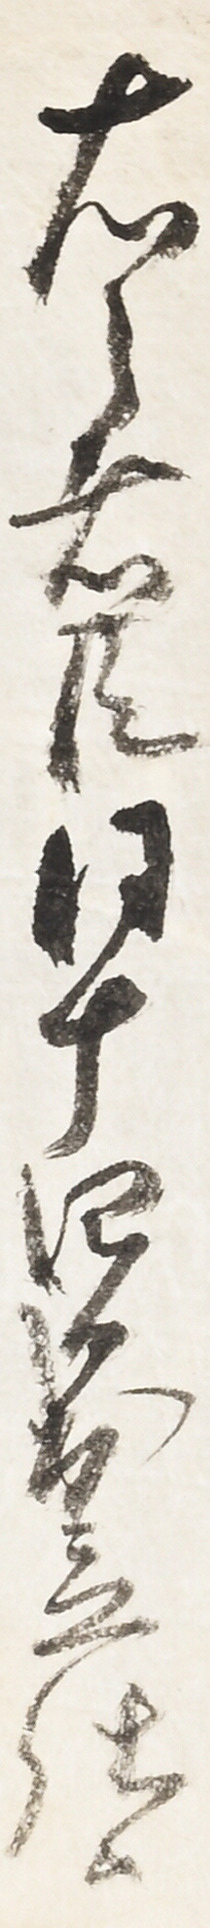右之者共同十四日出立仕候
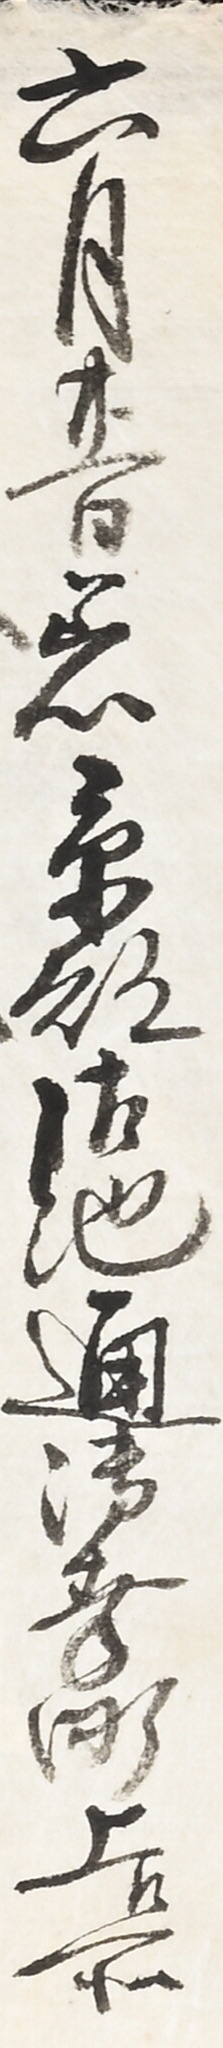六月廿一日着京都御池通御幸町上ル所
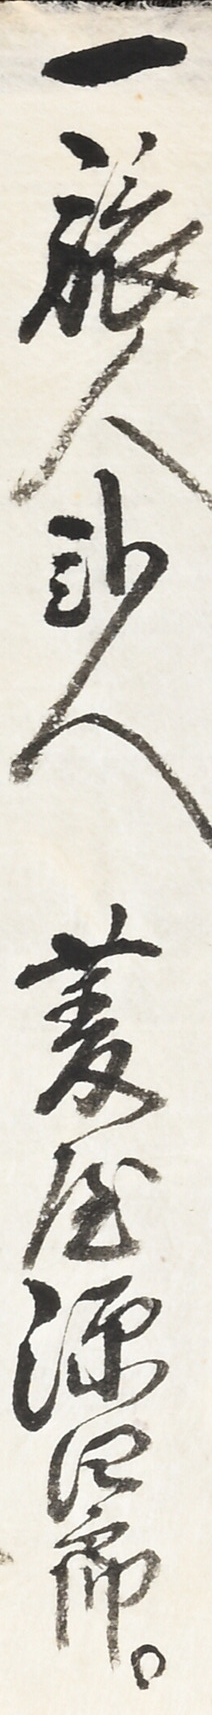一旅人弐人菱屋源四郎〇
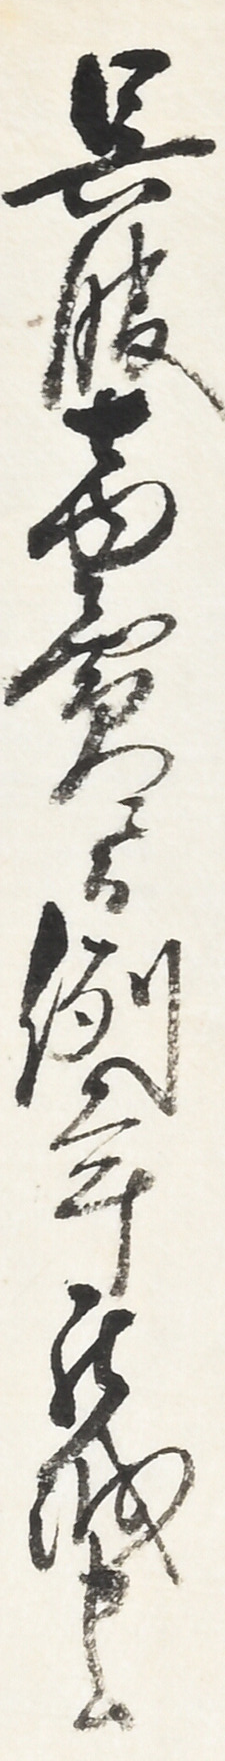呉服商売ニ而例年罷越申候
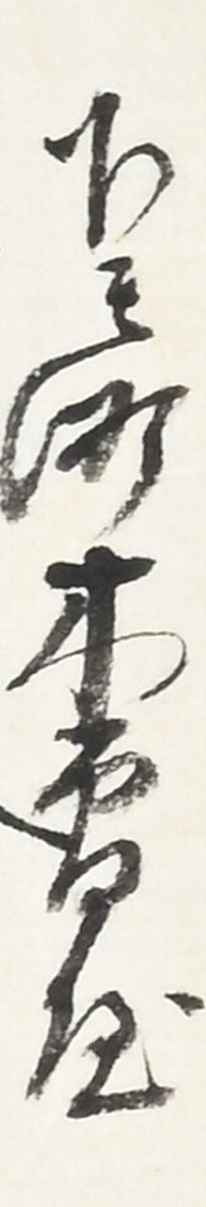下モ町木曽屋
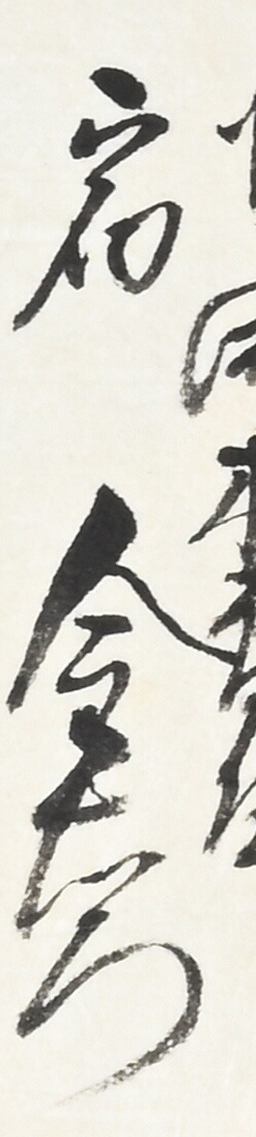宿金右衛門
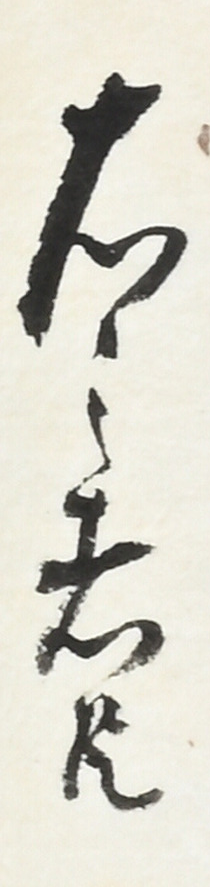右之者共
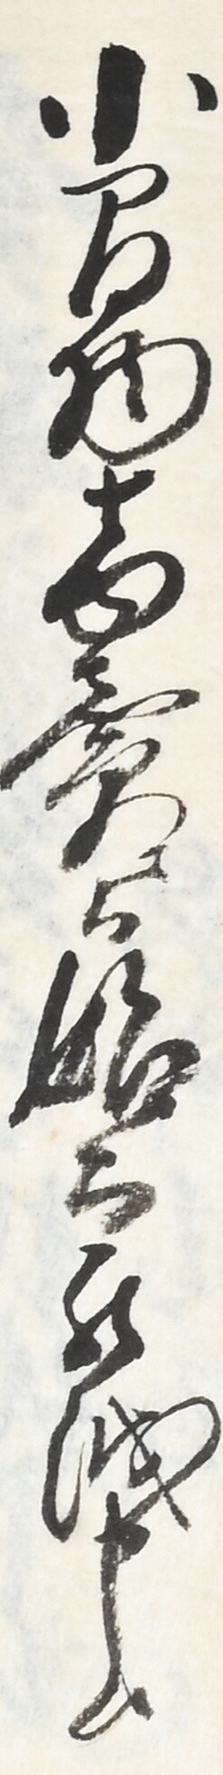小間物商売ニ而例年罷越申候
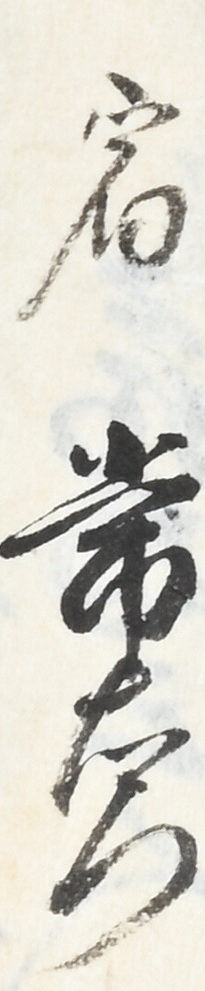宿金右衛門

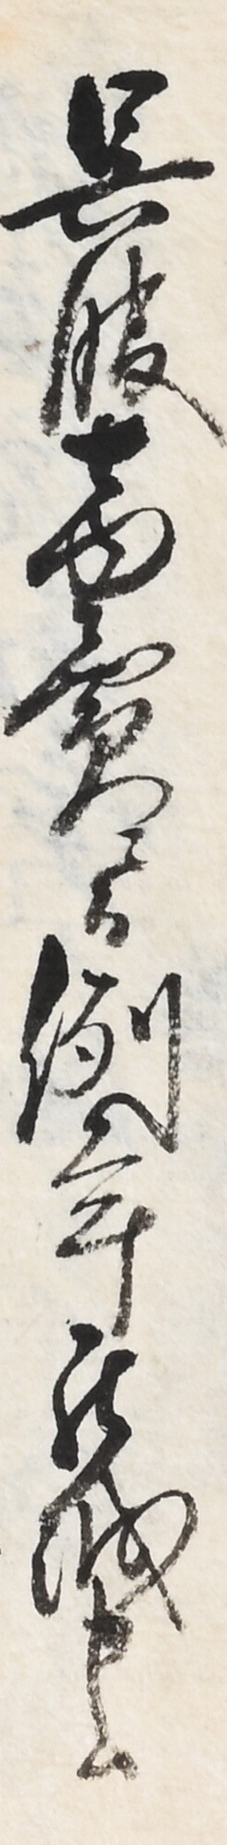薬商売ニ而例年罷越申候
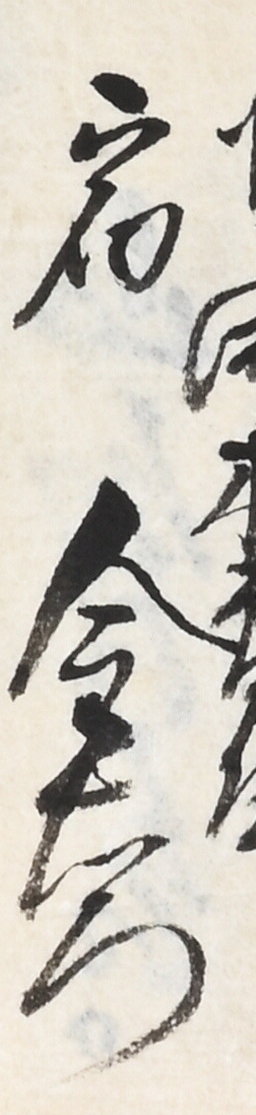宿常右衛門
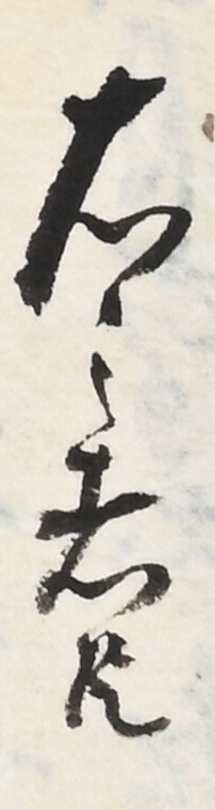右之者共
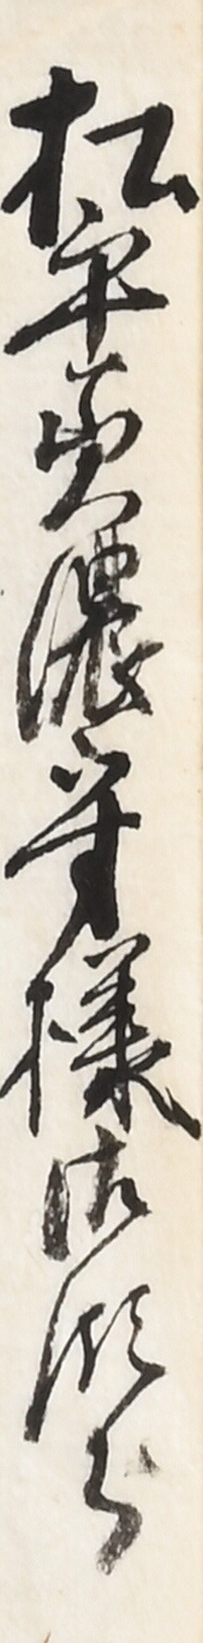松平美濃守様御領分
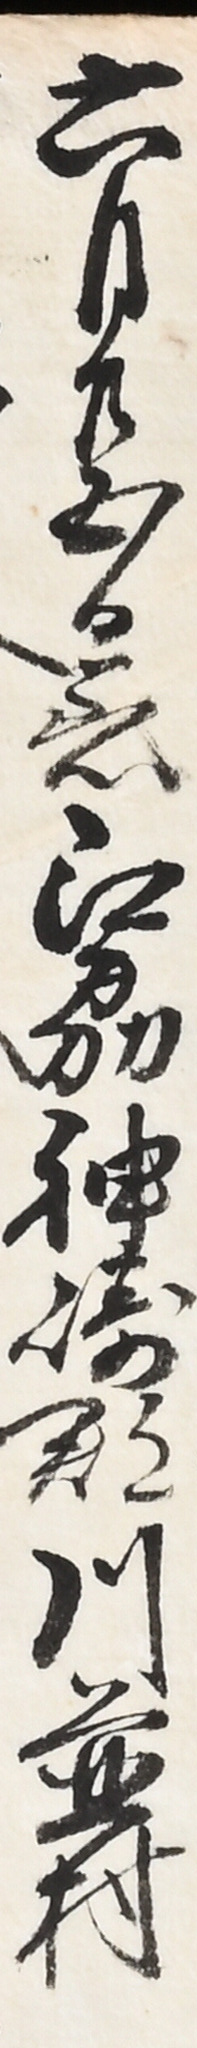六月廿五日着江州神崎郡川並村
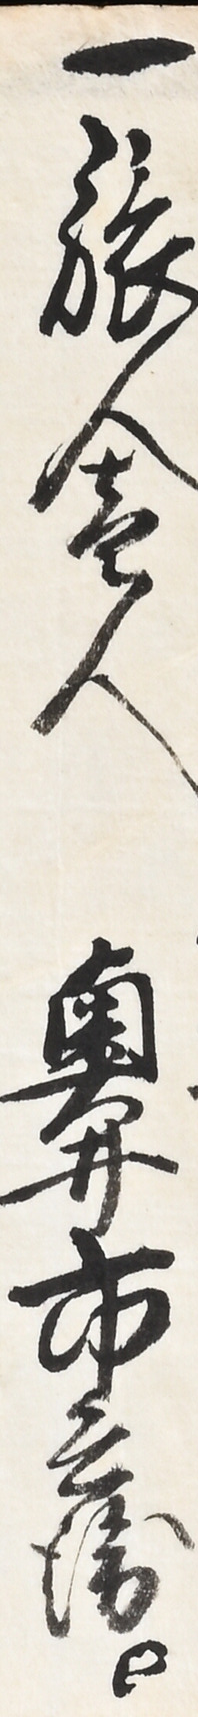一旅人壱人奥井市兵衛〇
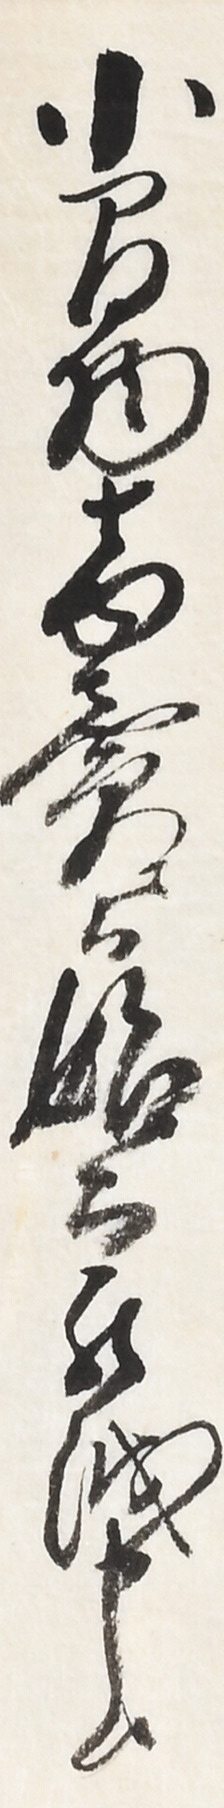小間物商売ニ而始而罷越申候
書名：旅人泊控帳
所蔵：伊那市立高遠町図書館・合同会社AMANE
